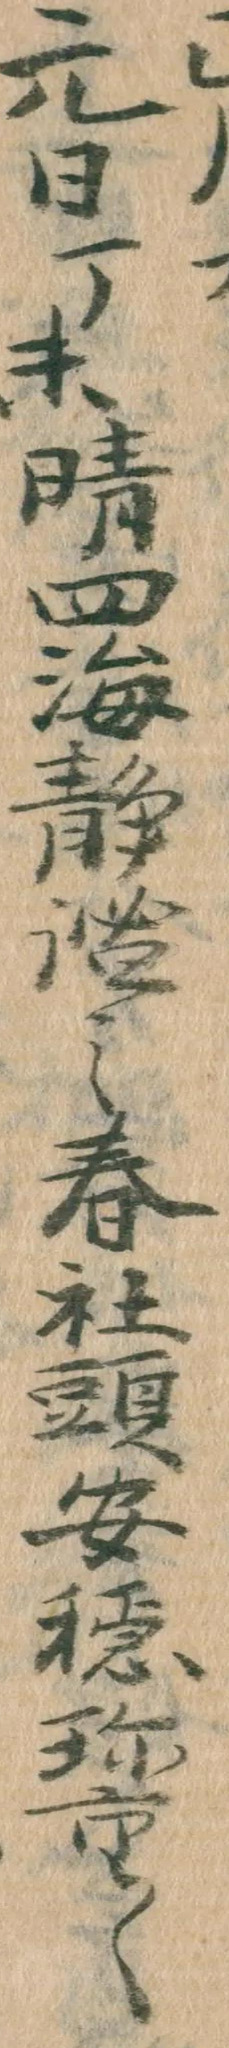元日丁未晴四海静謐之春社頭安穏珎重〳〵
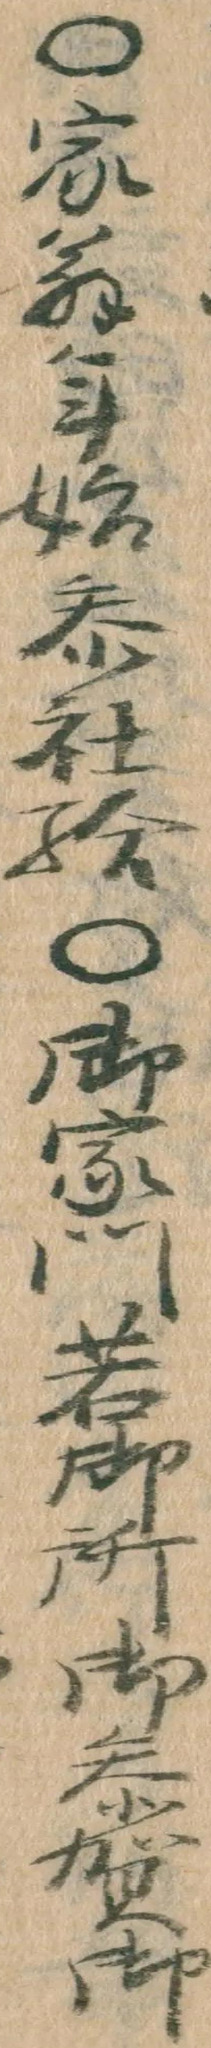○家翁年始参社給○御家門若御所御参賀御
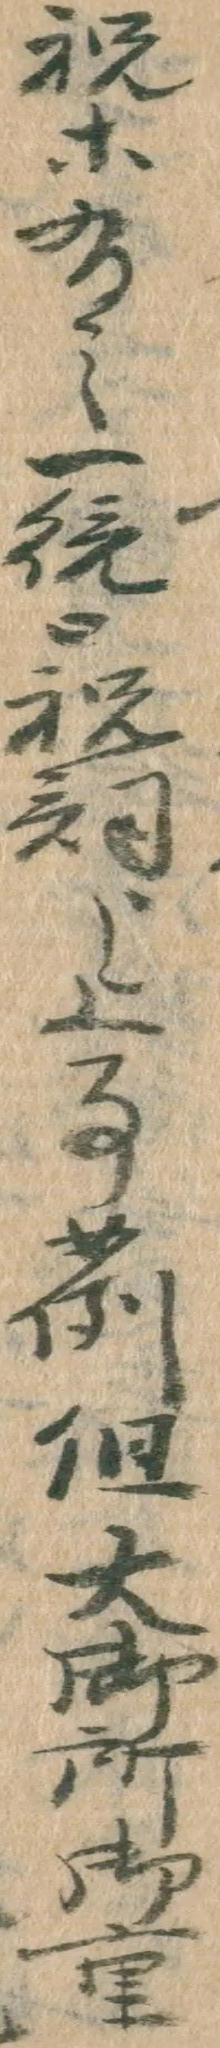祝等有之一統御祝詞申上事如例但大御所御重
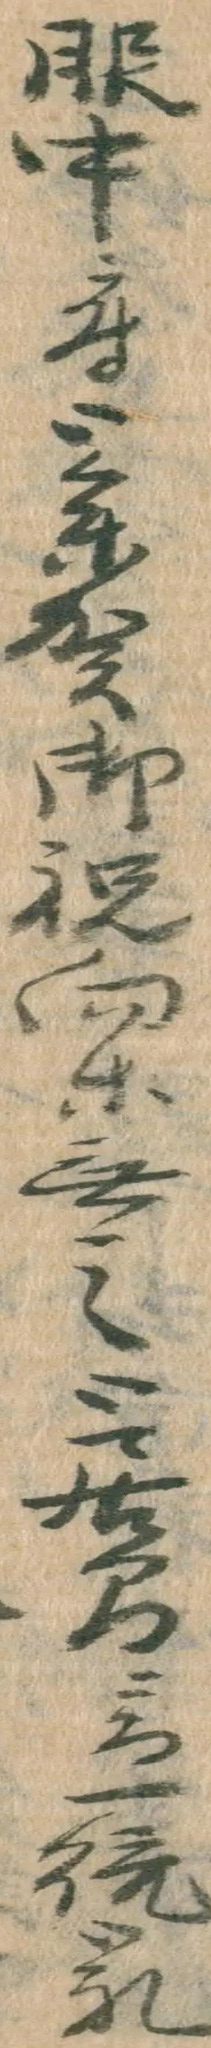服中ニ付御参賀御祝向等無之御居間ニ而一統御礼
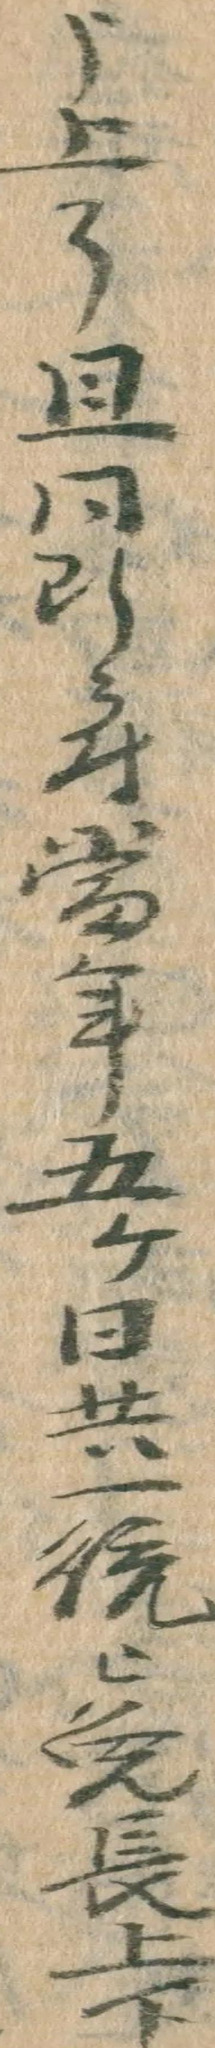申上了且同断ニ付當年五ヶ日共一統被免長上下
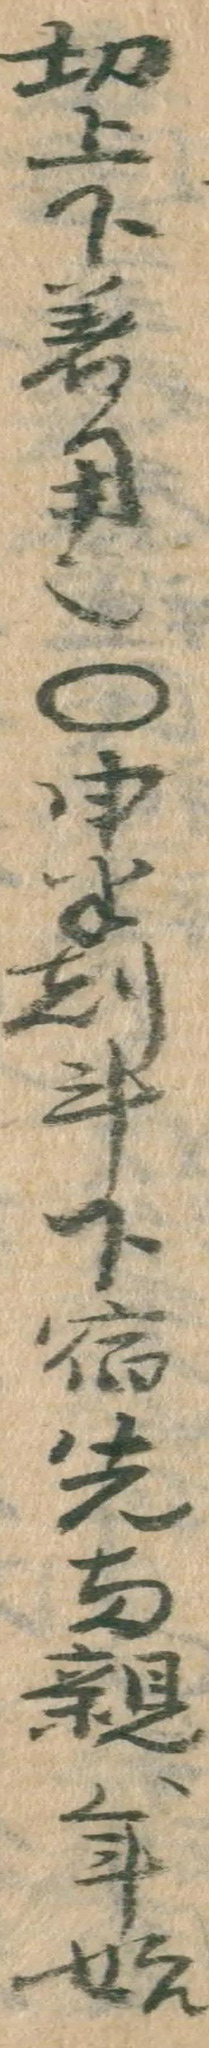切上下着用也○申半刻斗下宿先両親ヘ年始
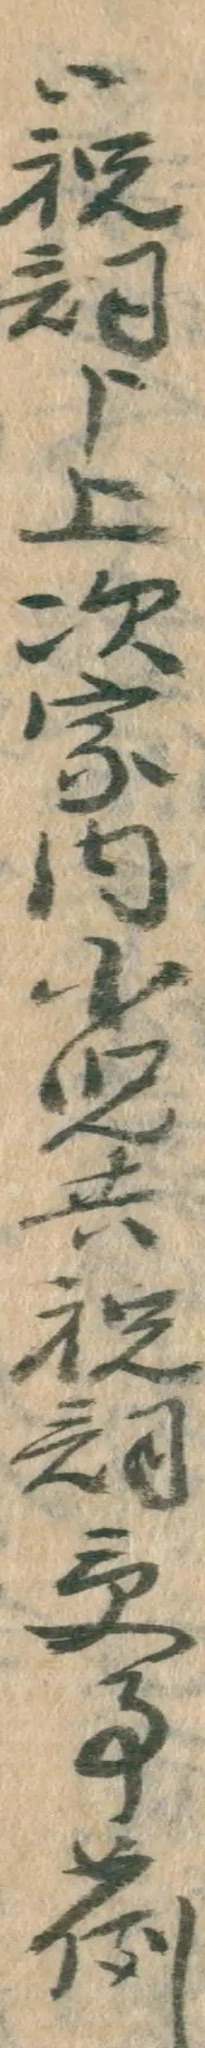御祝詞申上次家内小児共祝詞受事如例
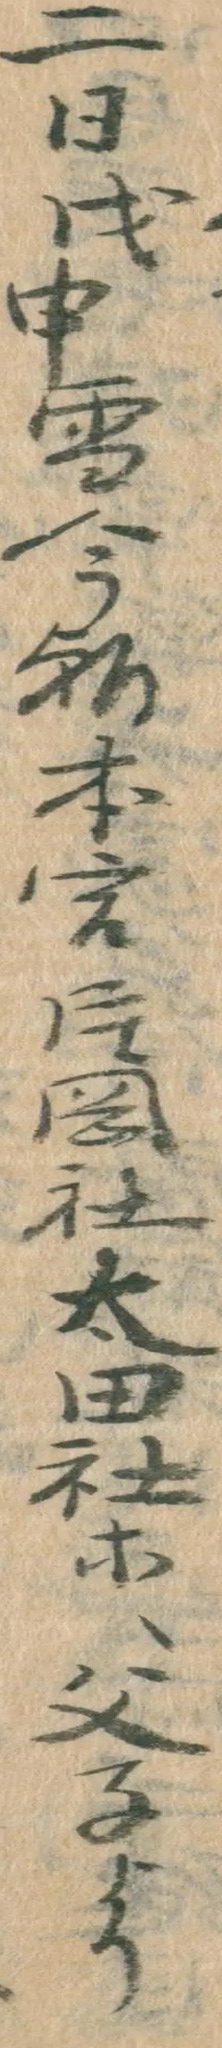二日戊申雪今朝本宮片岡社太田社等へ父子より
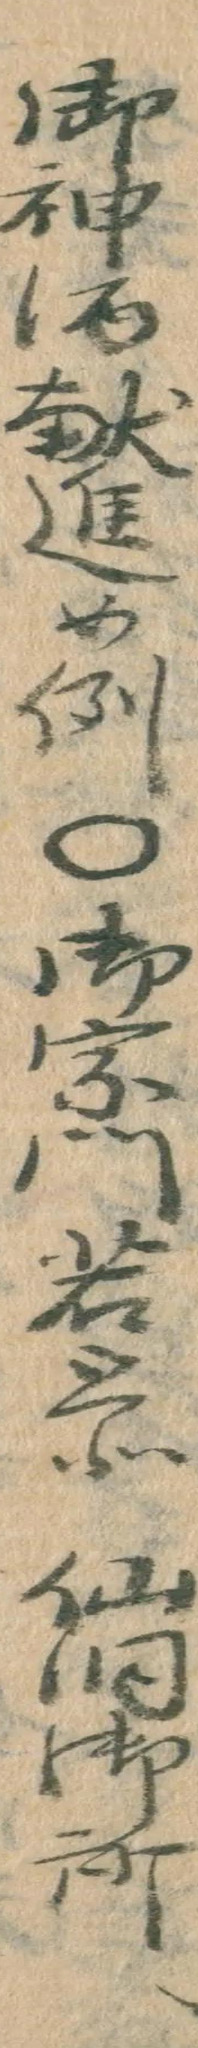御神酒献進如例○御家門若御所仙洞御所へ
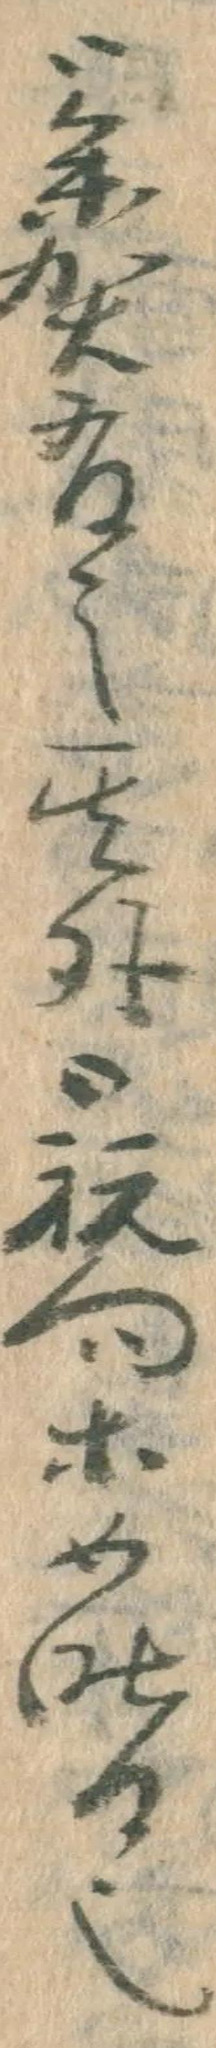御参賀有之其外御祝向等如昨日也

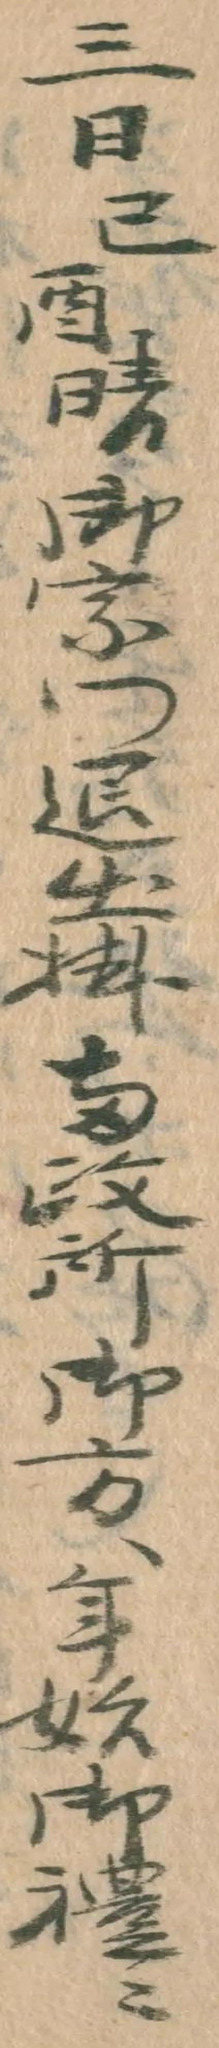三日己酉晴御家門退出掛両政所御方年始御禮ニ
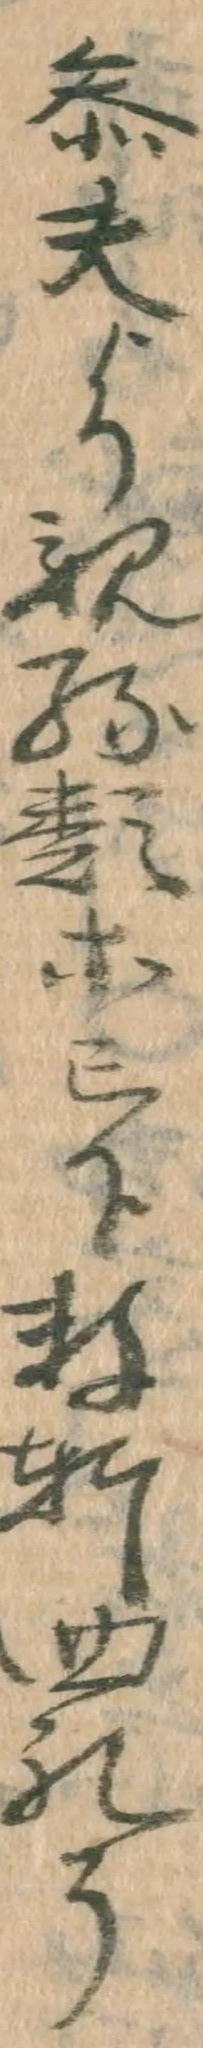参夫より親縁類等已下数軒四礼了
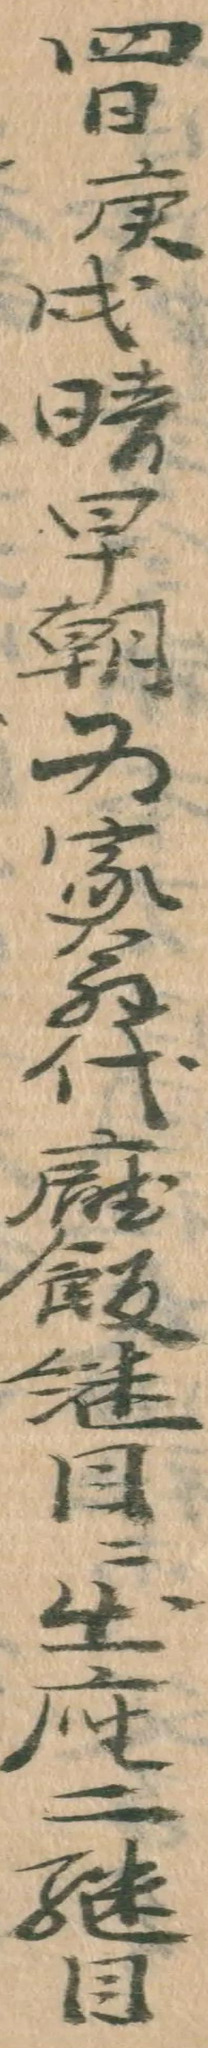四日庚戌晴早朝為家翁代廳飯継目ニ出座二継目
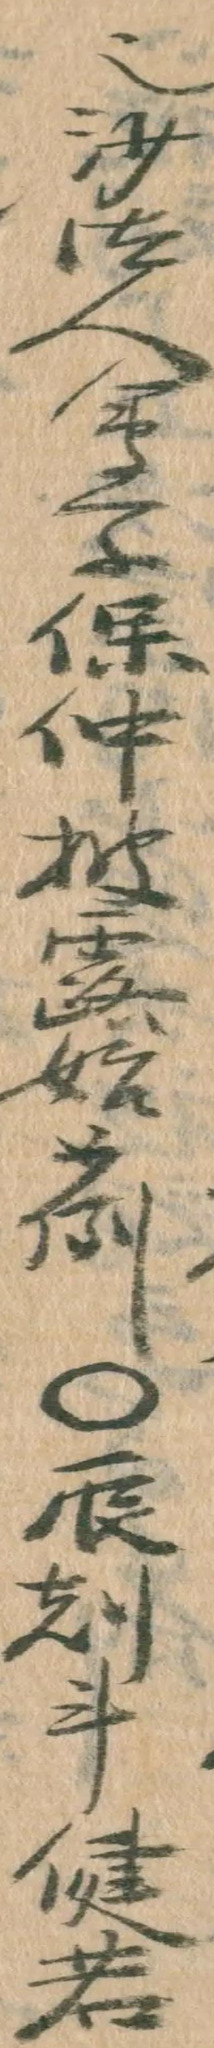也沙汰人會所保仲披露始如例〇辰刻斗健若
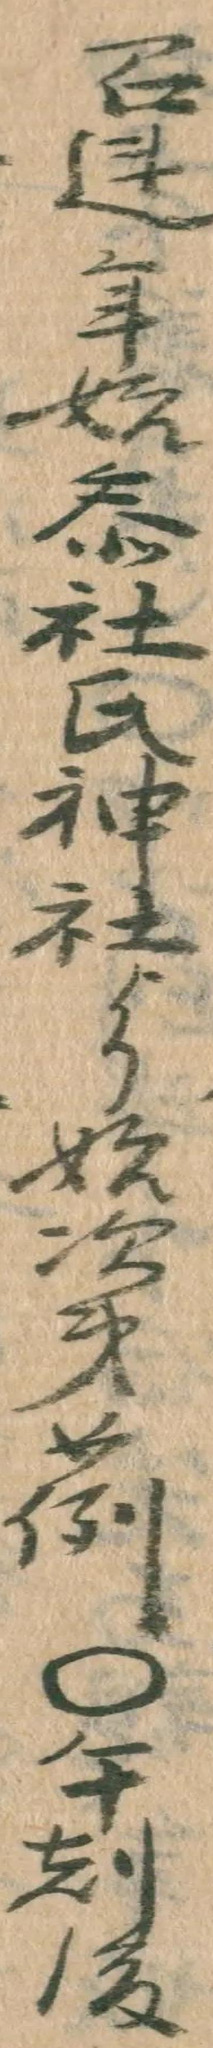召連年始参社氏神社より始次第如例〇午刻後
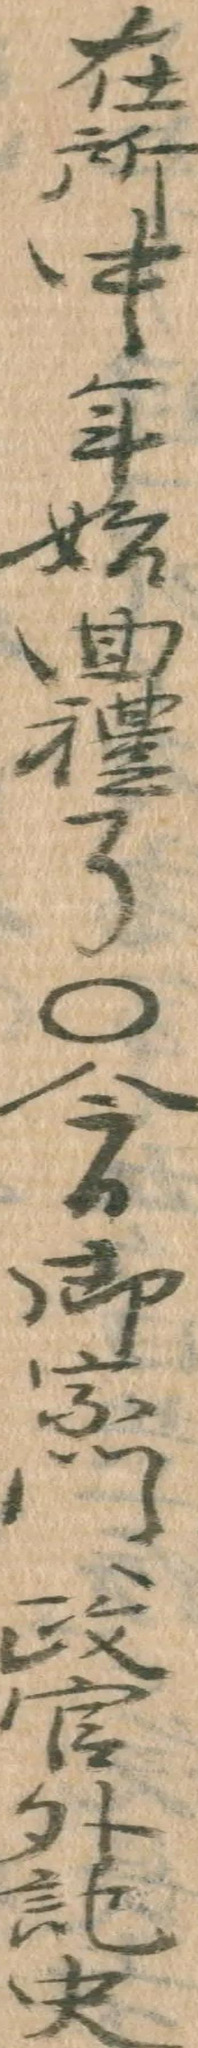在所中年始回禮了○今日御家門へ政官外記史
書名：賀茂社記録. 第63冊
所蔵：国立国会図書館 National Diet Library, JAPAN
